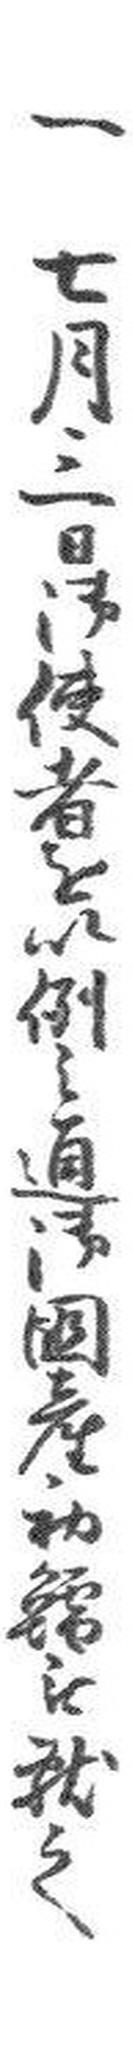一七月三日御使者を以例之通御国産初鱈被献之
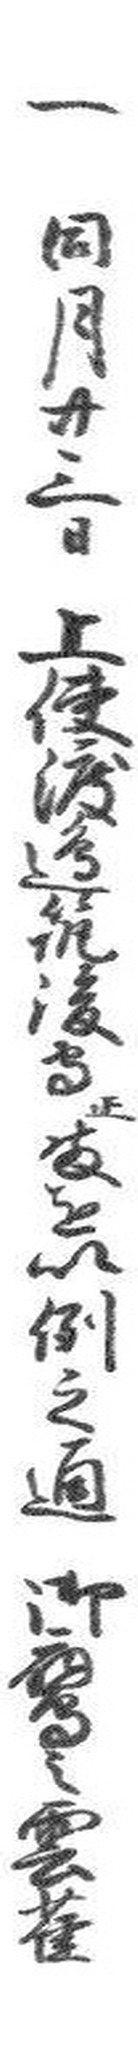一同月廿三日上使渡辺筑後守正殿を以例之通御鷹之雲雀
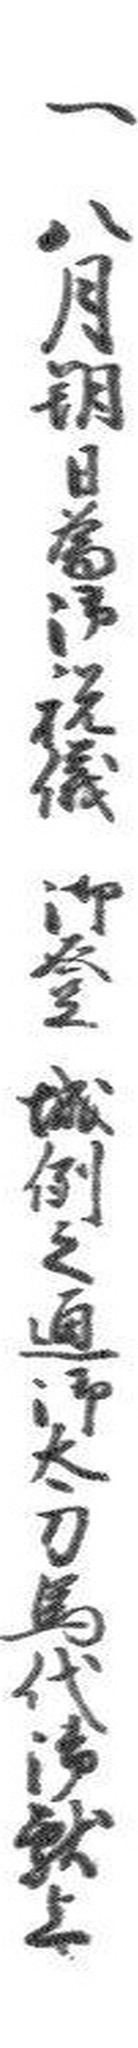一八月朔日為御祝儀御登城例之通御太刀馬代御献上
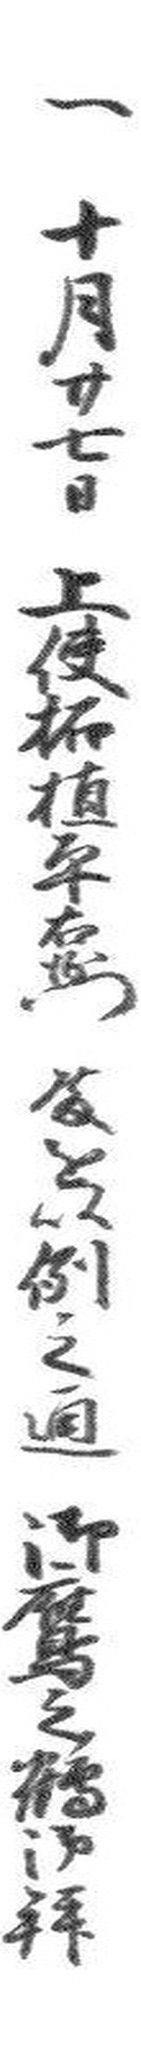一十月廿七日上使柘植平右衛門殿を以例之通御鷹之鶴御拝
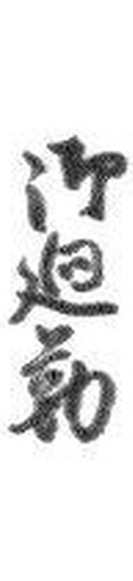御廻勤
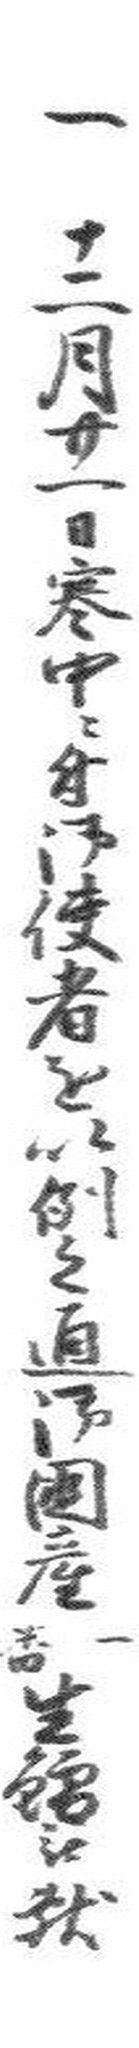一十二月廿一日寒中ニ付御使者を以例之通御国産一番生鱈被献
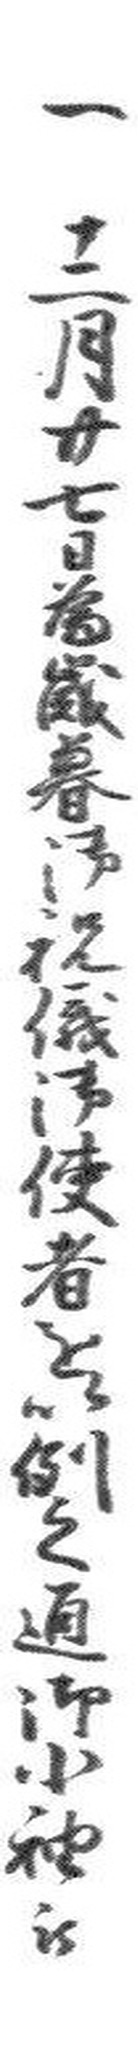一十二月廿七日為歳暮御祝儀御使者を以例之通御小袖被献之

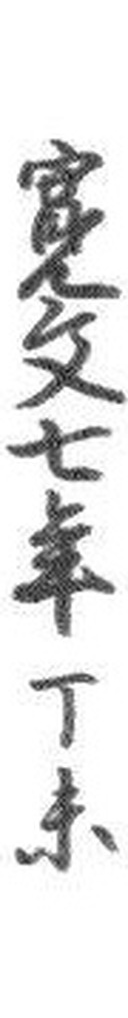寛文七年丁未
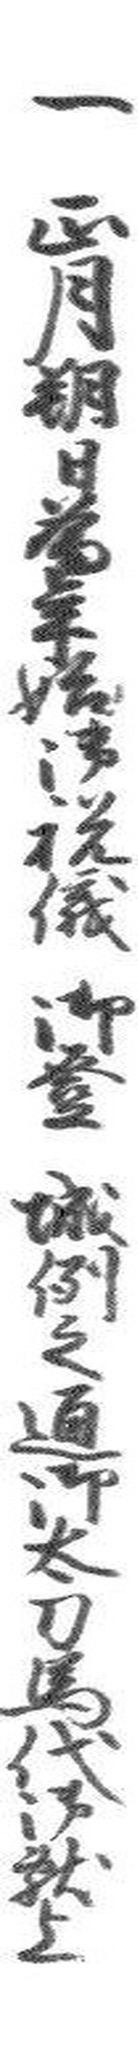一正月朔日為年始御祝儀御登城例之通御太刀馬代御献上
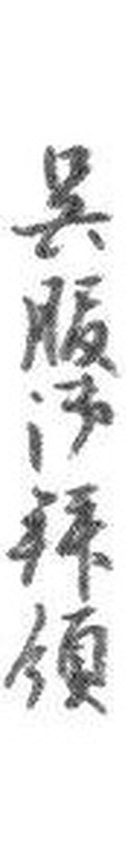呉服御拝領
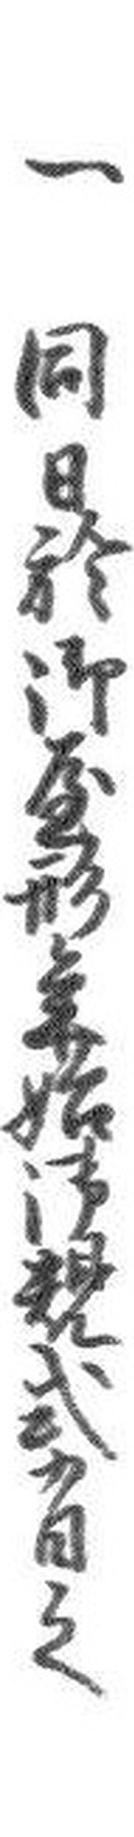一同月於御屋形年始御規式有之
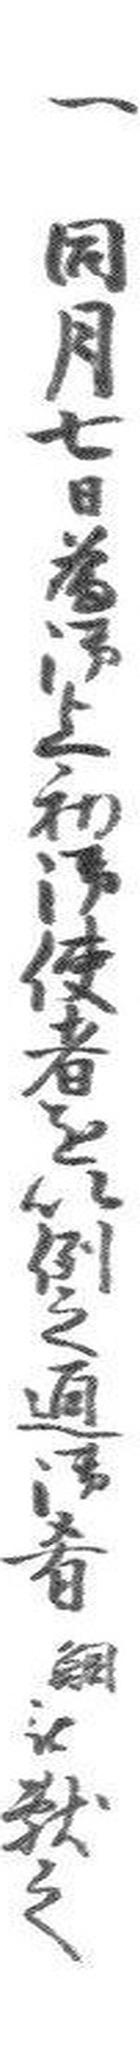一同月七日為御上初御使者を以例之通御肴鯛被献之
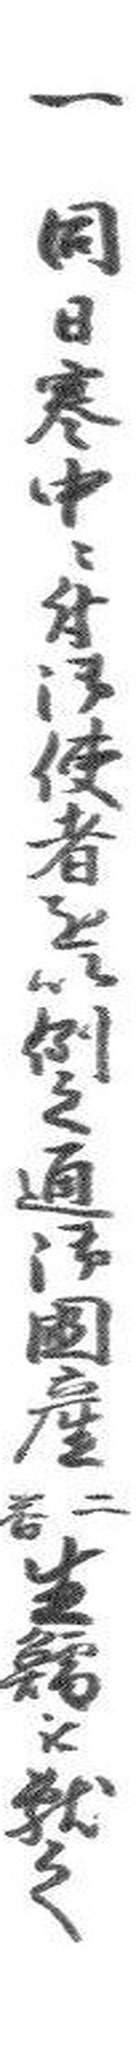一同日寒中ニ付御使者を以例之通御国産二番生鱈被献之
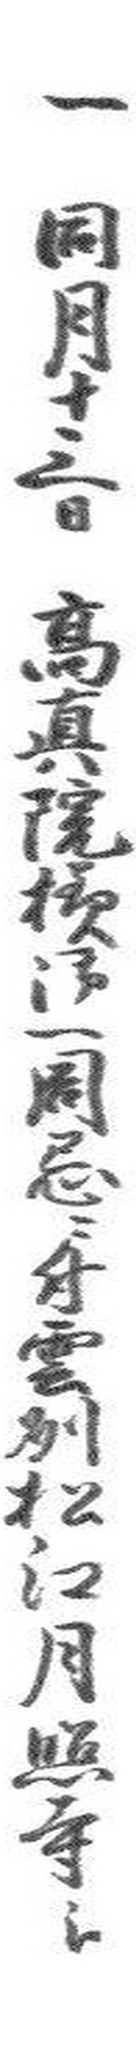一同月十三日高真院様御一周忌ニ付雲州松江月照寺江
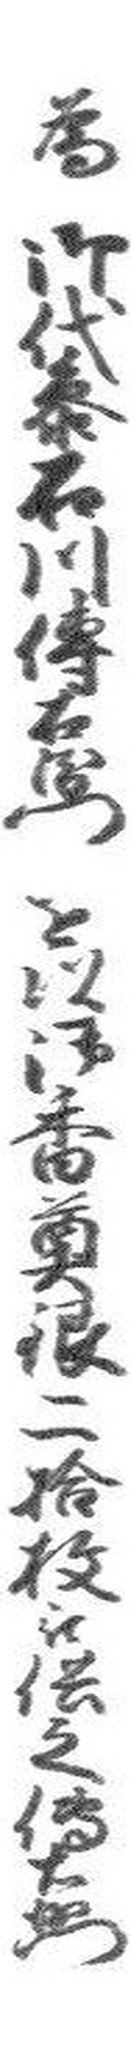為御代参石川伝右衛門を以御香奠銀二拾枚被供之伝右衛門

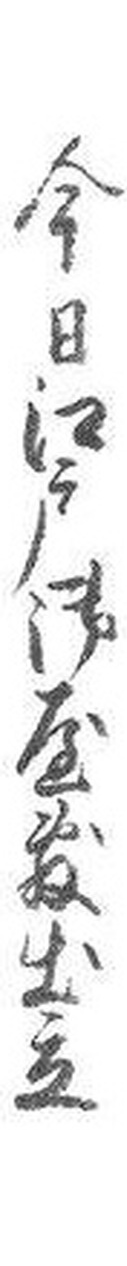今日江戸御屋敷出立
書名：家譜 七 光通公 従寛文四年到同九年
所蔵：福井県文書館 Fukui Prefectural Archives
